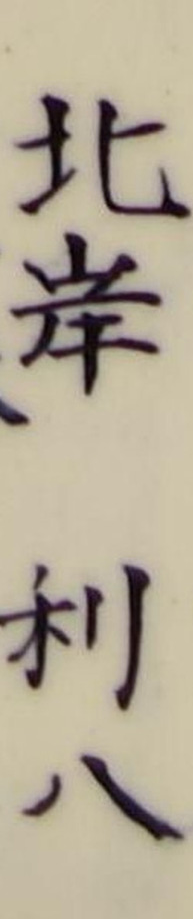北岸利八
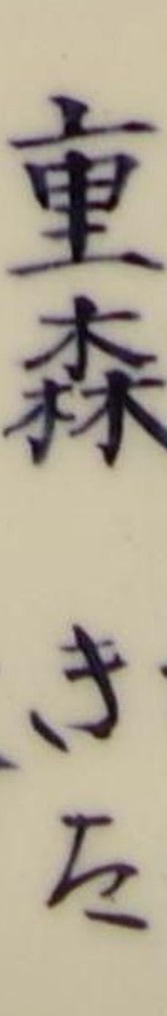重森き太
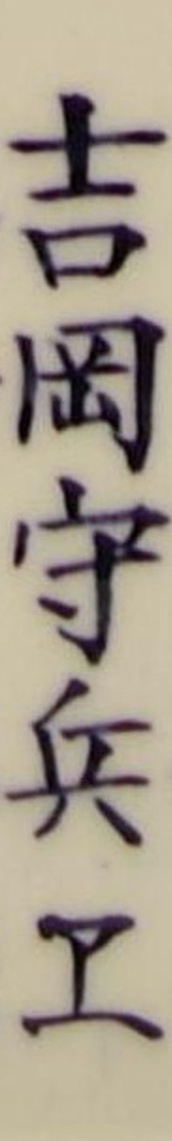吉岡守兵ヱ
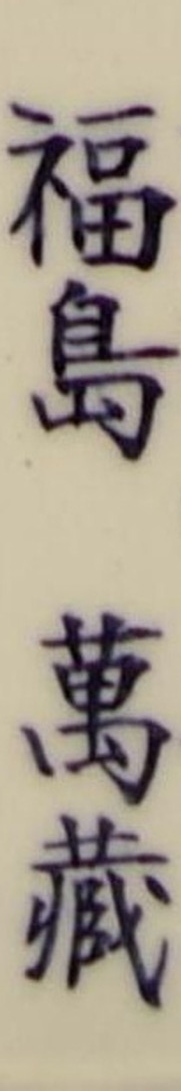福島萬蔵
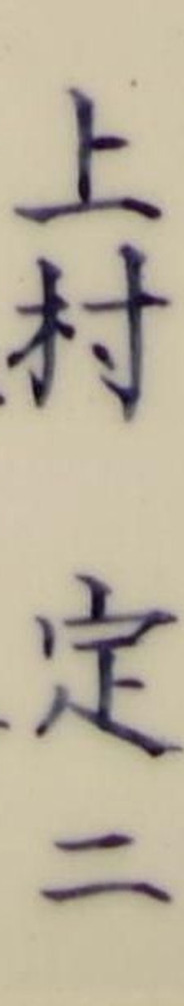上村定二
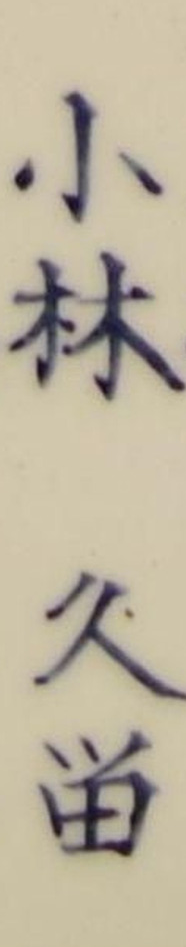小林久留
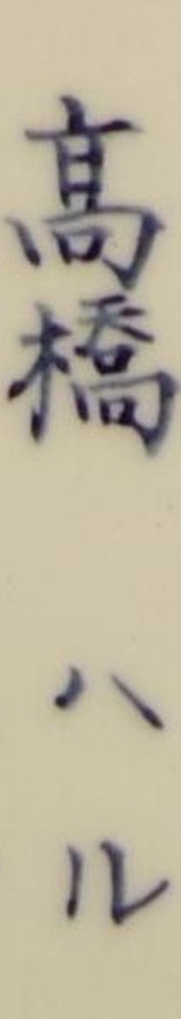高橋ハル
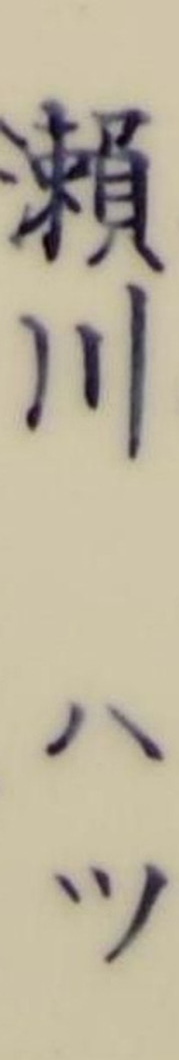瀬川ハツ
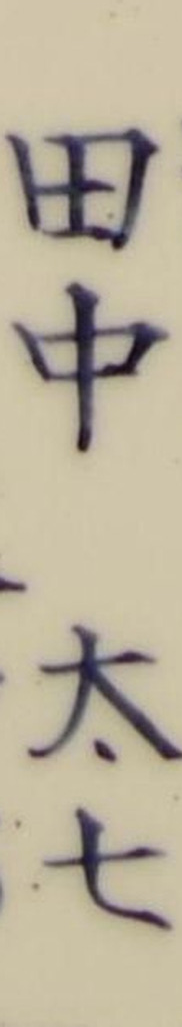田中太七
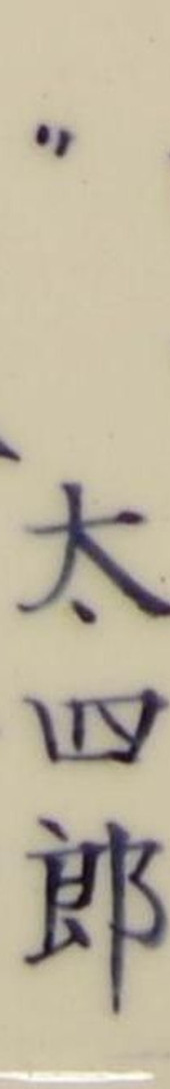太四郎
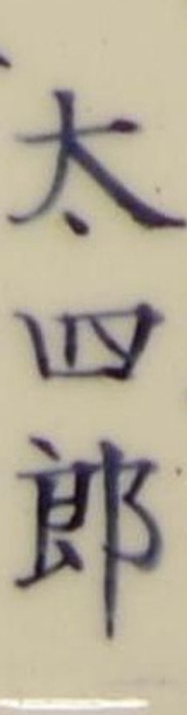太四郎
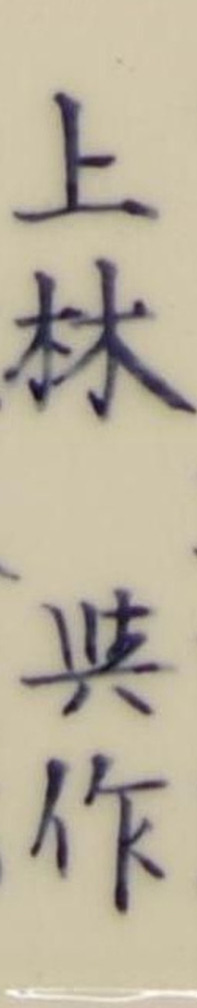上林与作
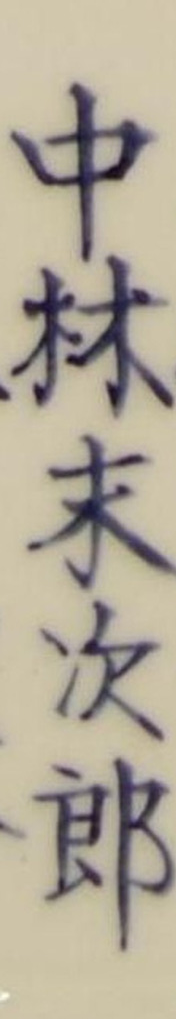中林末次郎
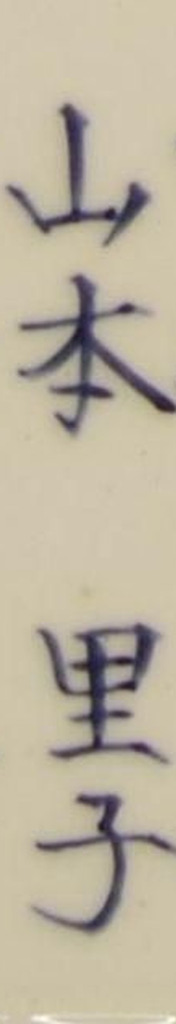山本里子
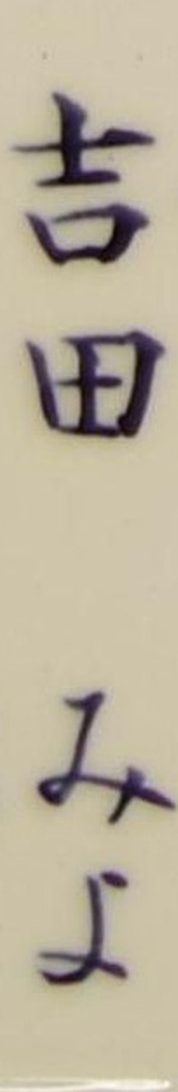吉田みよ
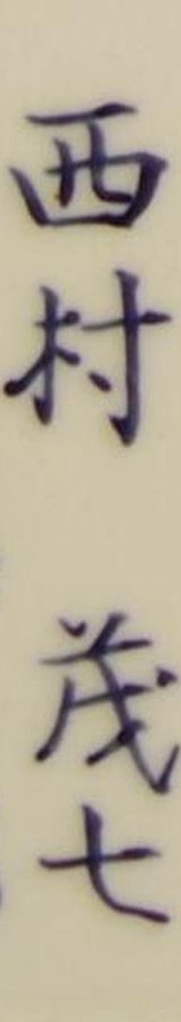西村茂七
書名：E~L
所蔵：高野山金剛峯寺
